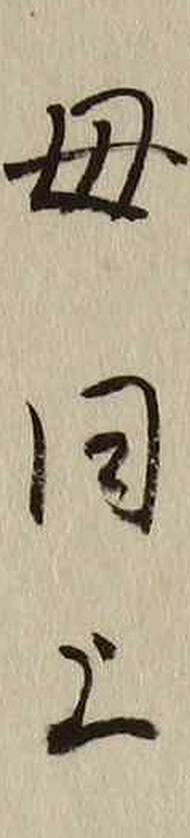母同上
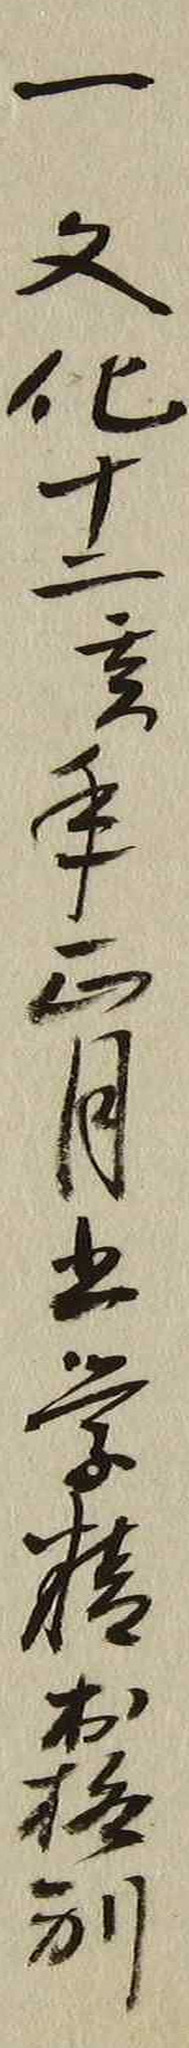一文化十二亥年正月書学精出格別
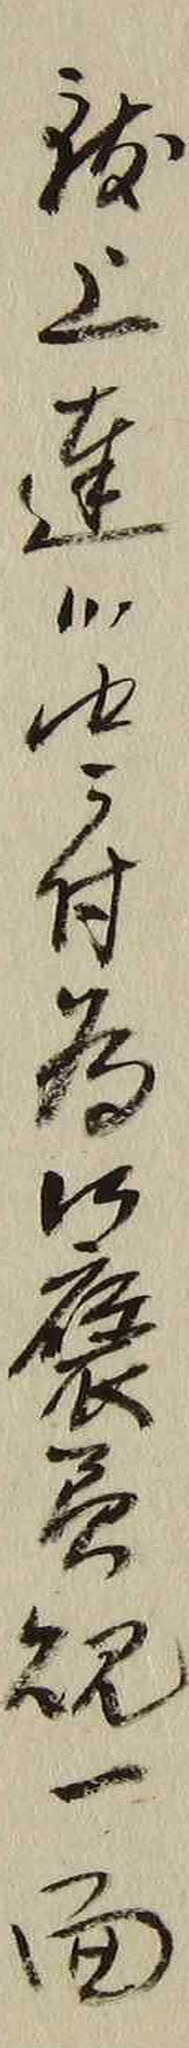致上達候由ニ付為御褒美硯一面
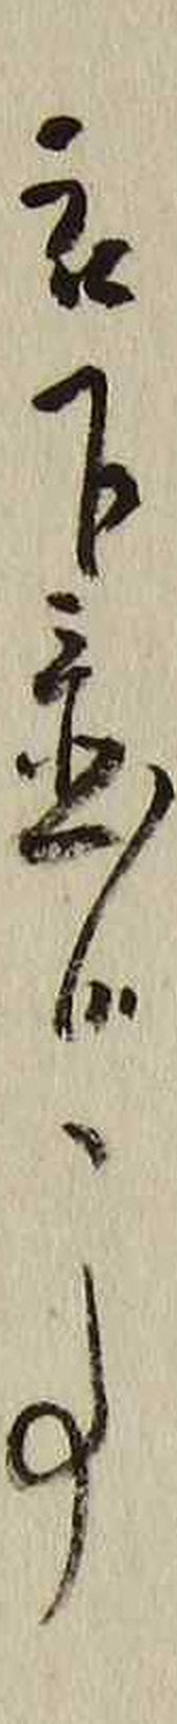被下置候事
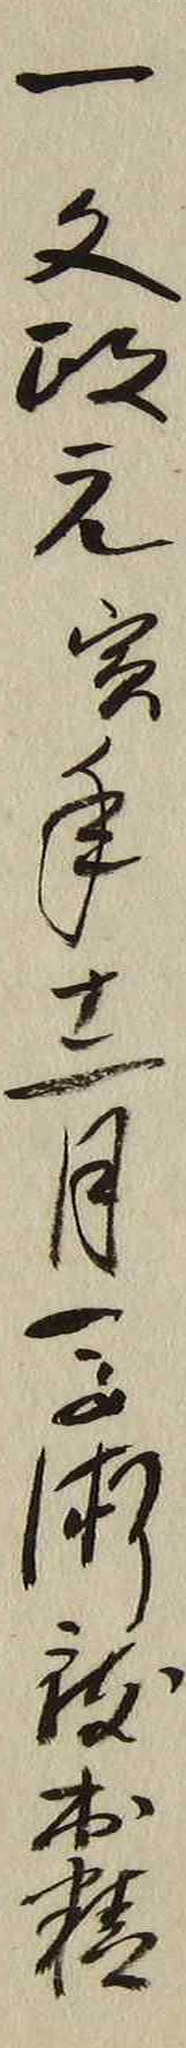一文政元寅年十二月馬術致出精
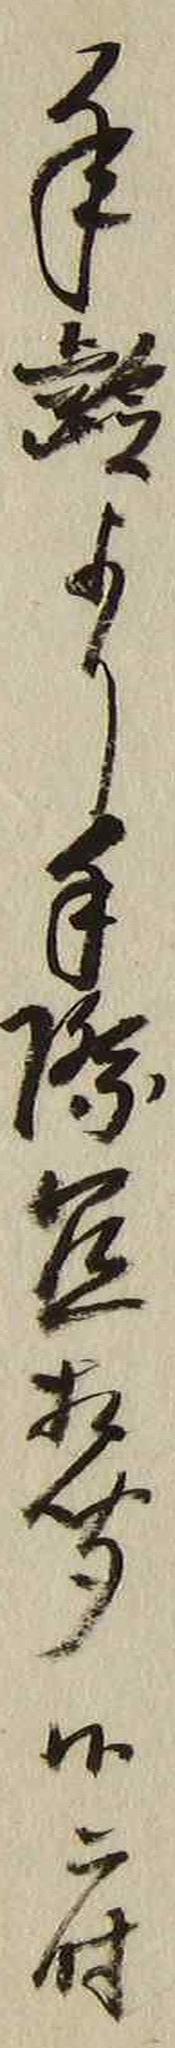年齢より手際宜相聞候ニ付
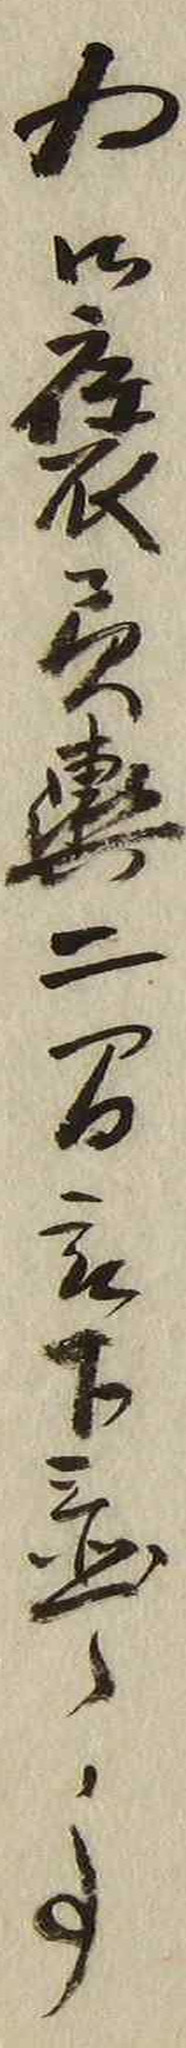為御褒美輿二間被下置候事

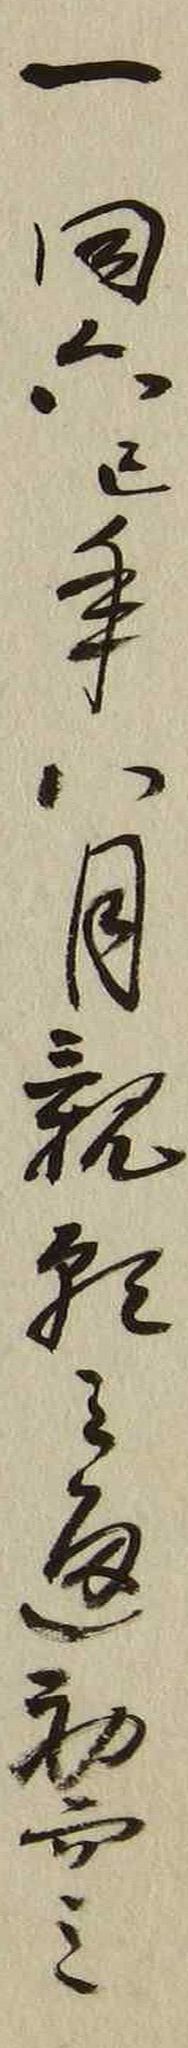一同六巳年八月親願之通初而之
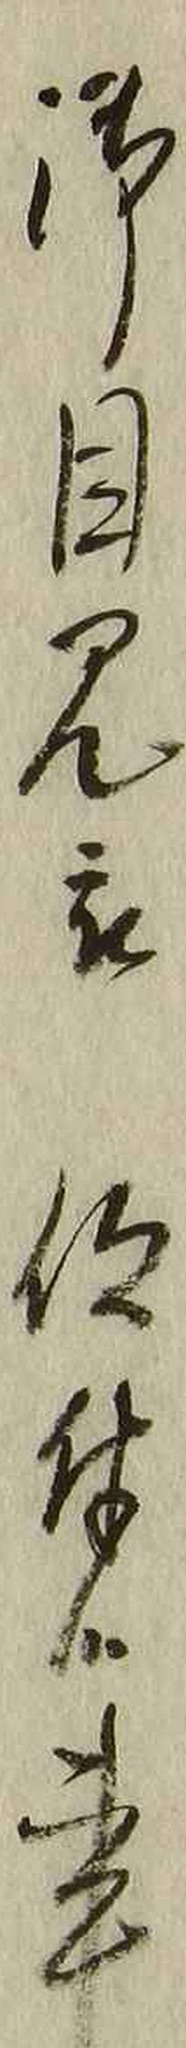御目見被仰付候事
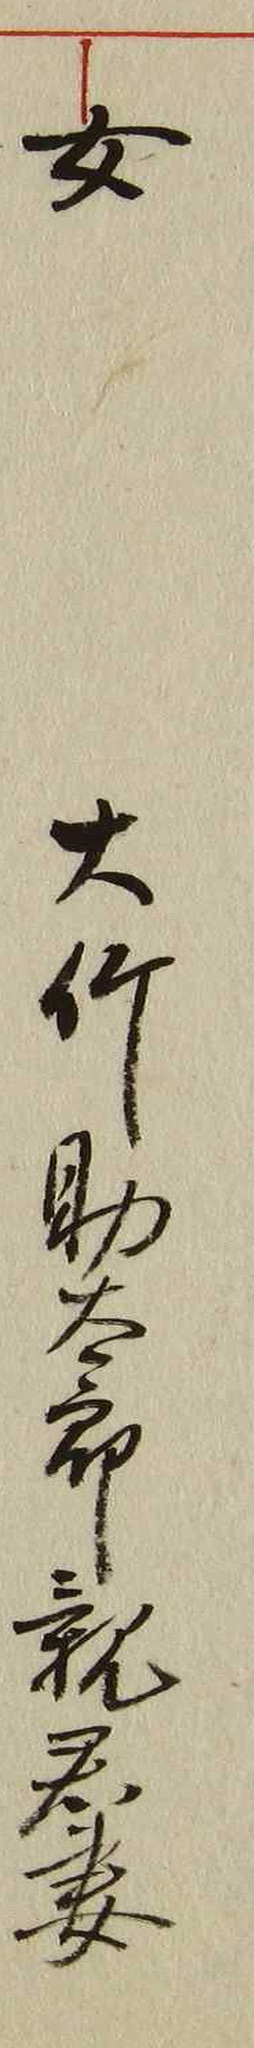女大竹助太郎親君妻
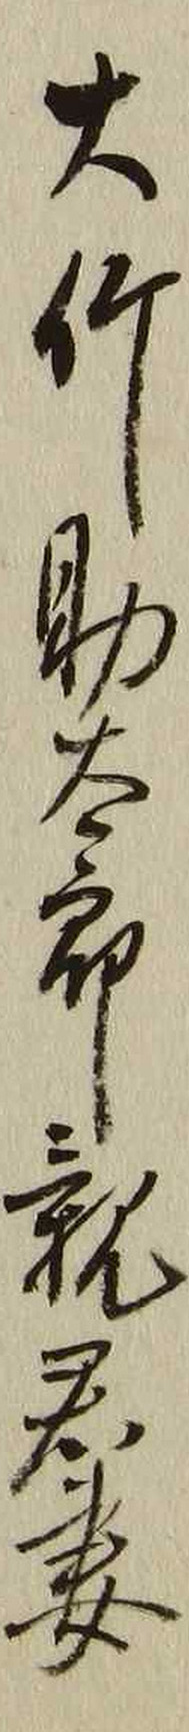女大竹助太郎親君妻
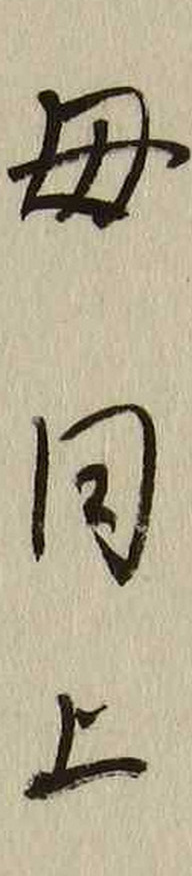母同上
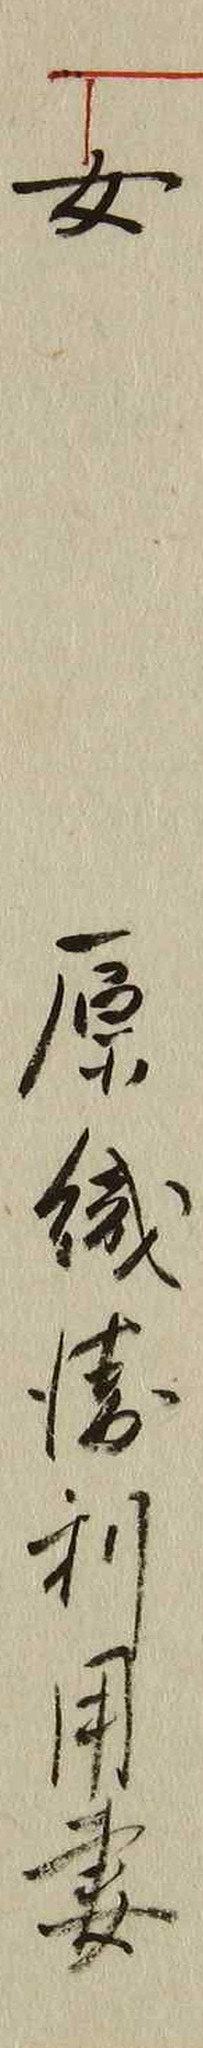女原織衛利用妻
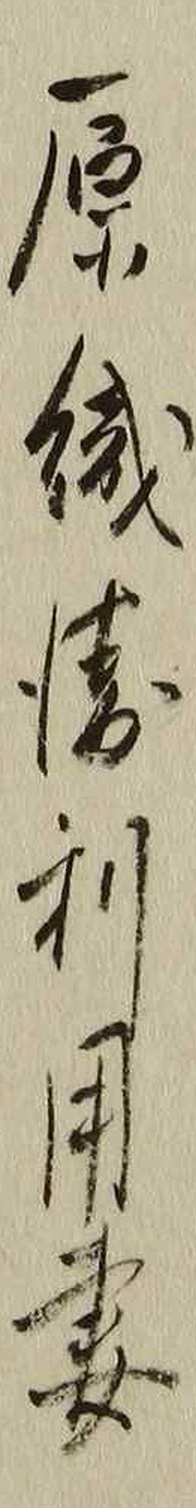女原織衛利用妻
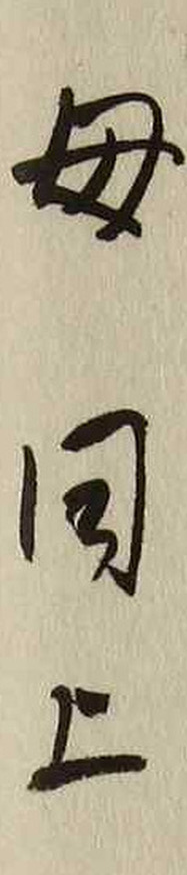母同上

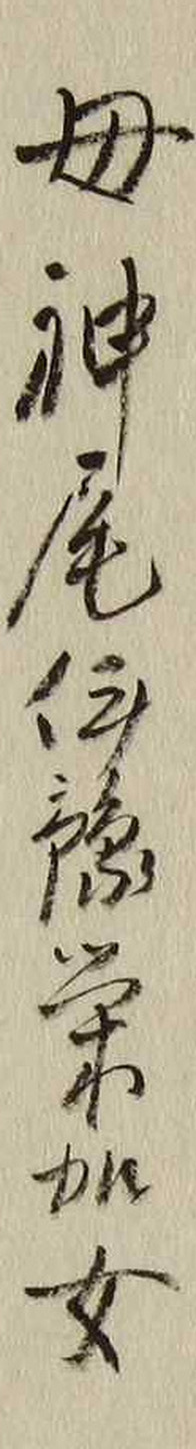母神尾伊予栄加女
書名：諸士系譜　巻之351　す之部1
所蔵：会津若松市立会津図書館
